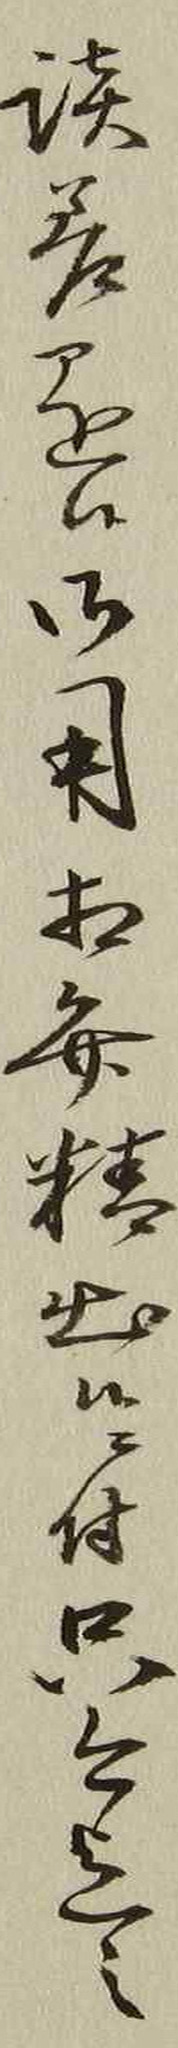談差懸候御用相弁精出候ニ付只今迄之
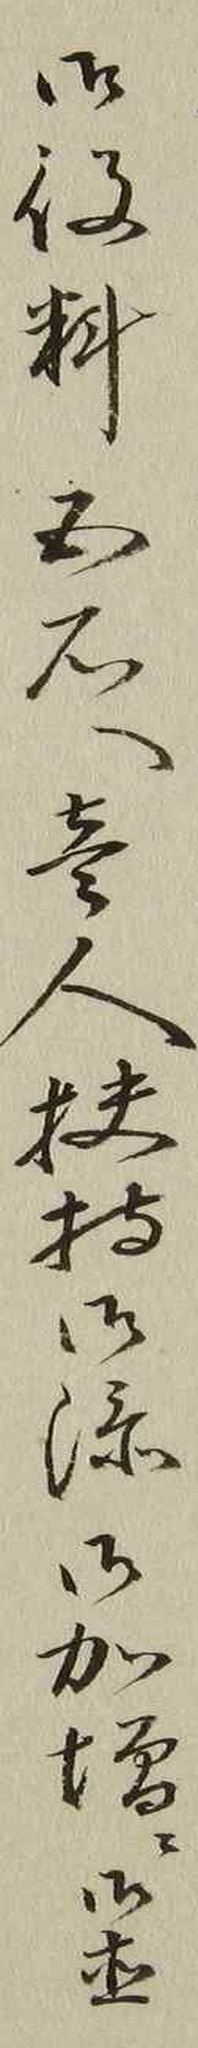御役料五石ヘ壱人扶持御添御加増ニ御直
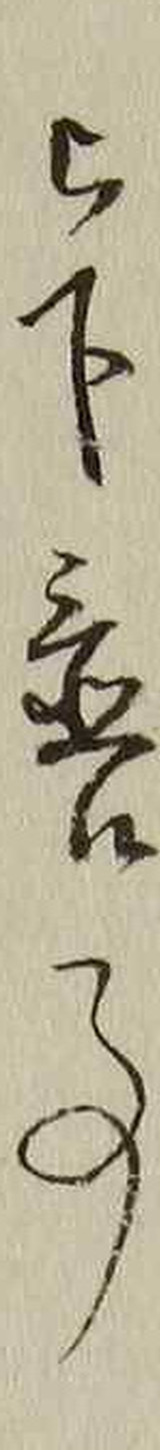被下置候事
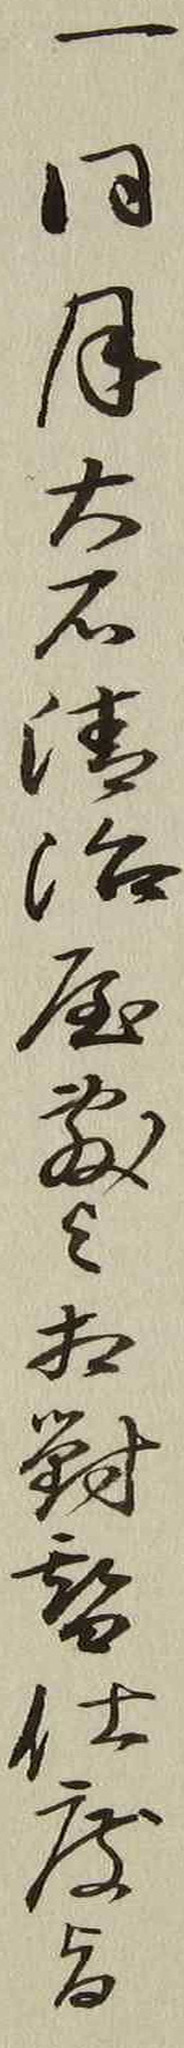一同月大石清治屋敷と相対替仕度旨
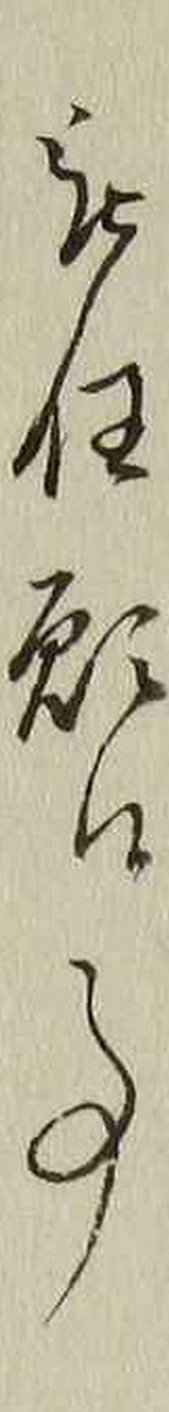被伺願候事
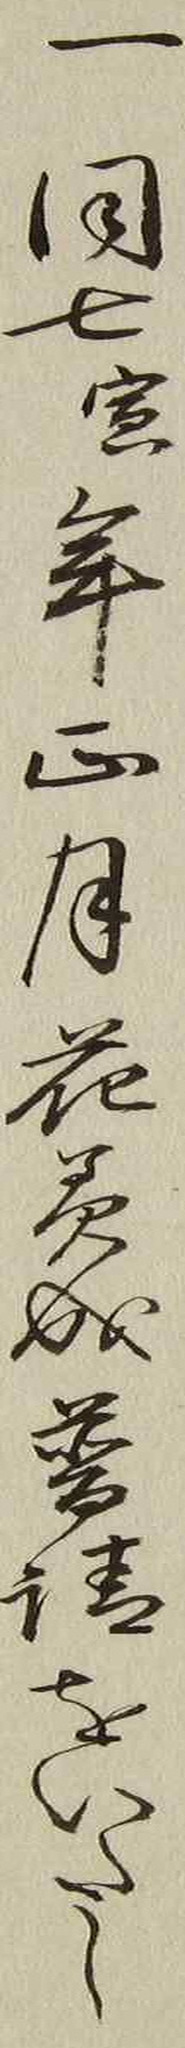一同七寅年正月花美成普請をいたし
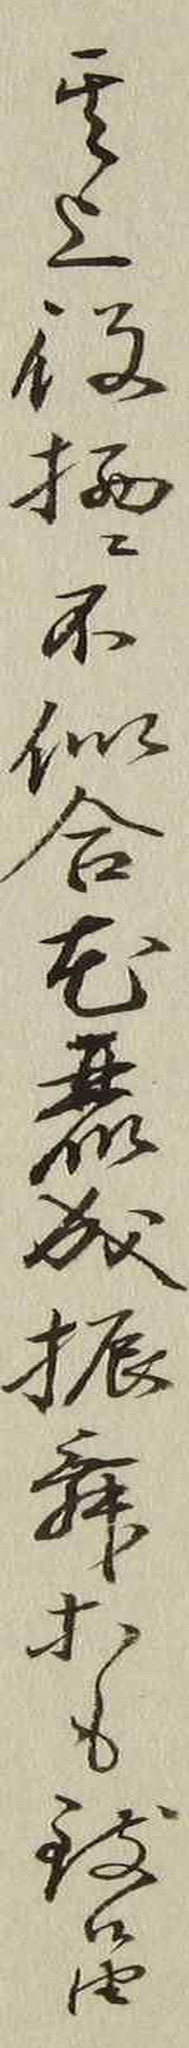其上役柄ニ不似合尤衰成振舞等も致候由
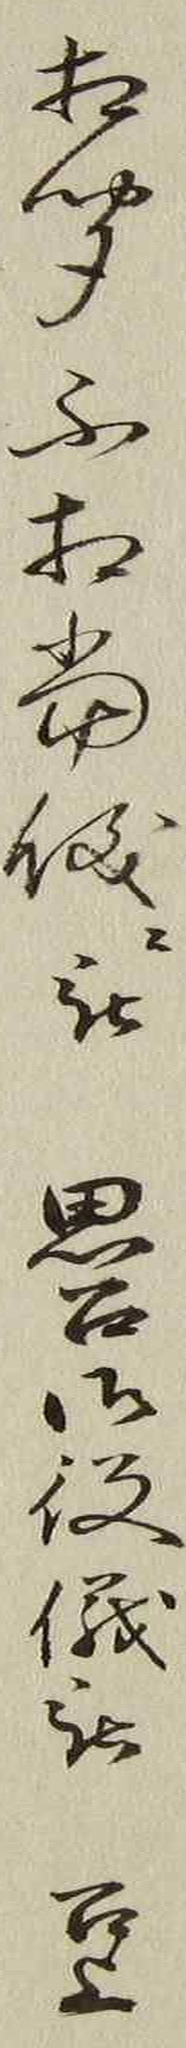相聞ふ相当儀ニ被思召御役儀被召上
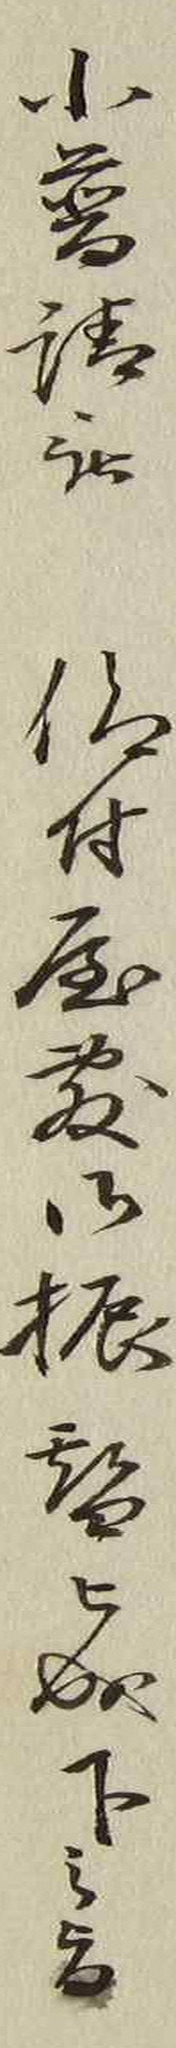小普請被仰付屋敷御振替被成下之旨
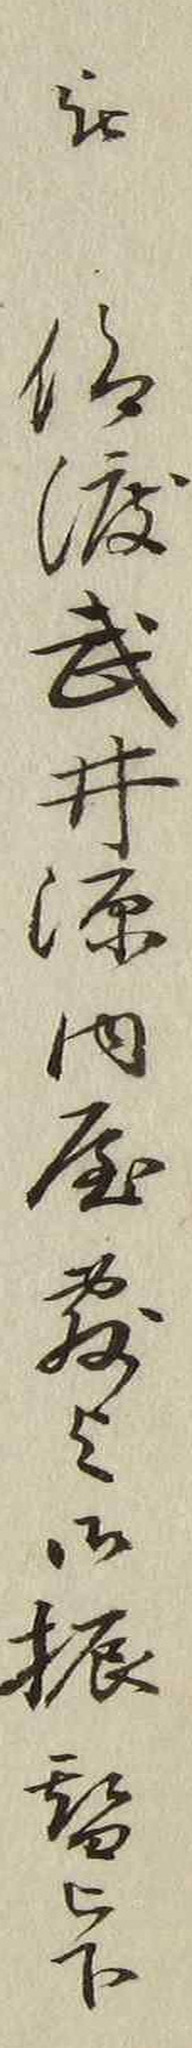被仰渡武井源内屋敷と御振替被下
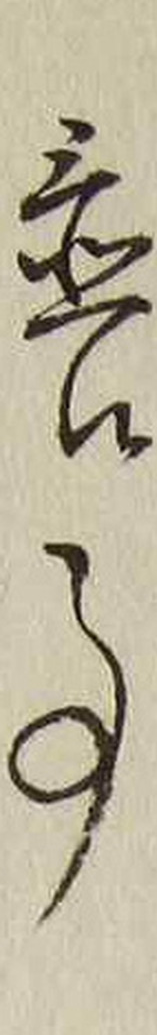置候事
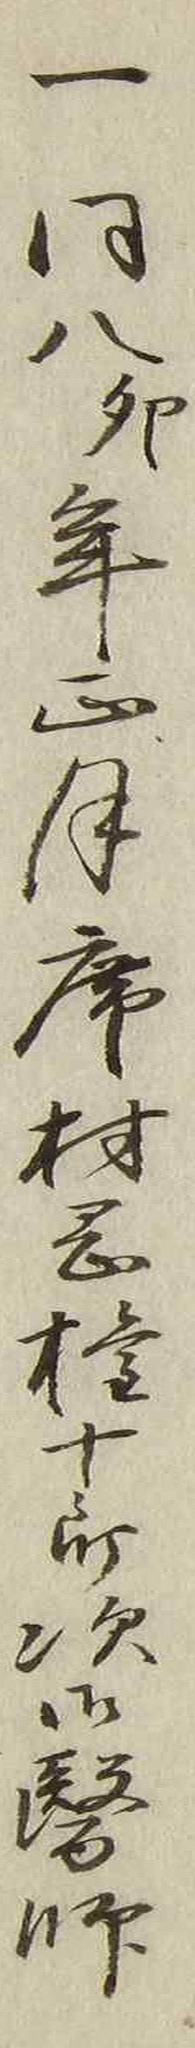一同八夘年正月席村岡権十郎次御医師
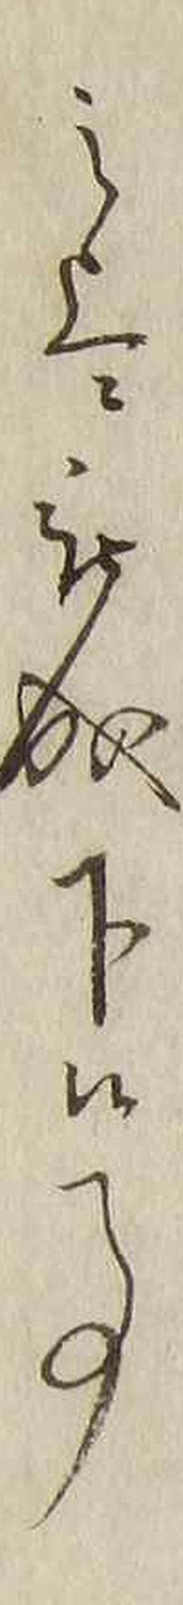之上ニ被成下候事

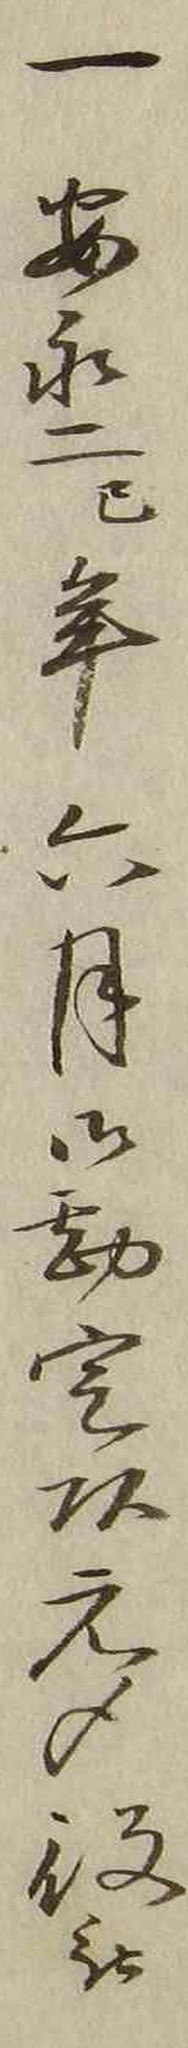一安永ニ巳年六月御勘定頭元〆役被
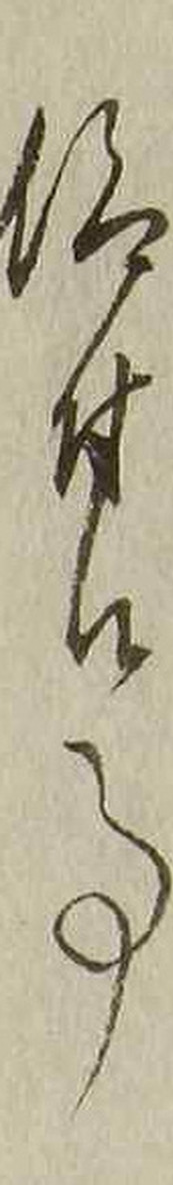仰付候事
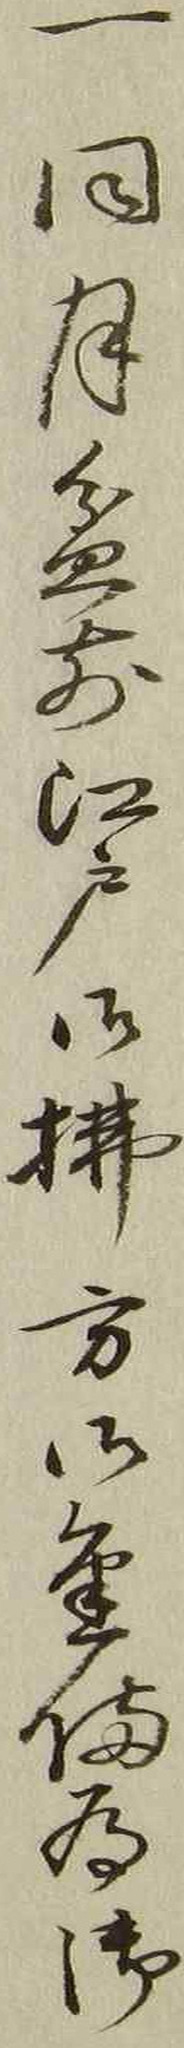一同月盆前江戸御払方御金備為御
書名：諸士系譜　巻之114　か之部22
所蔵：会津若松市立会津図書館
